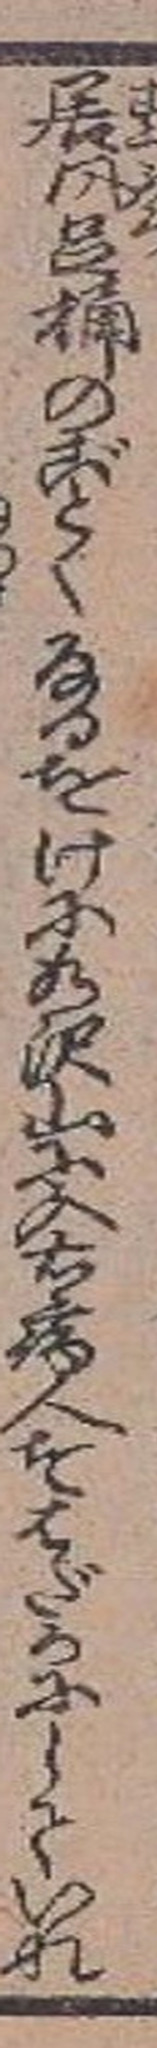居風呂桶のごとくなるをけに水沢山に入右病人をはだかにしていれ
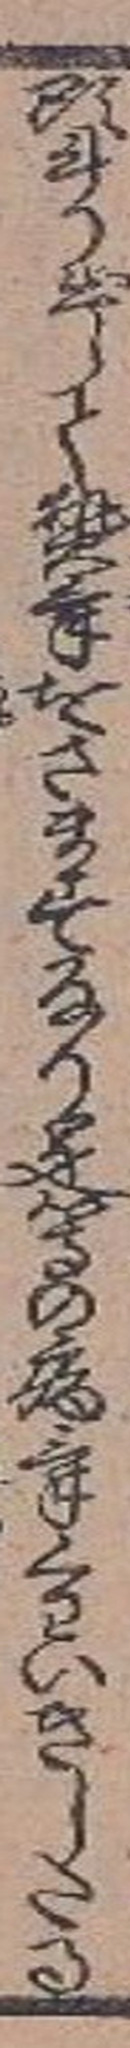頭計りだして熱気をさますなり是等の病気くわいきしたる
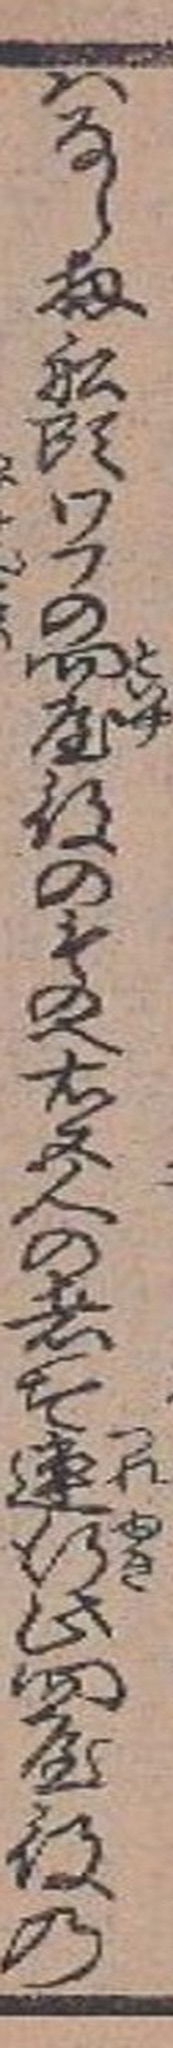はなし扨船頭ワフの問屋役のものへ右五人の者を連行此問屋役の
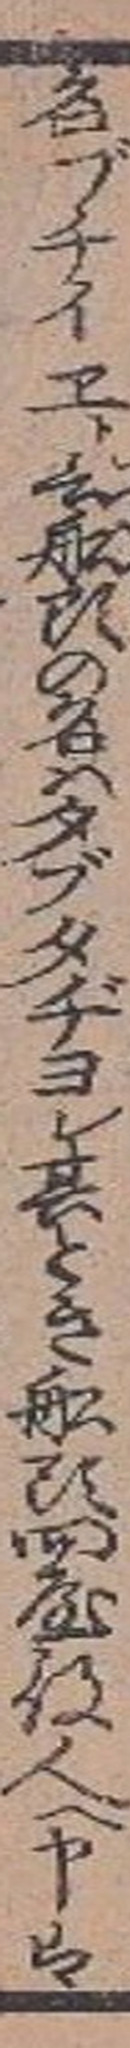名ブチイヱと云船頭の名はタブタヂヨン其とき船頭問屋役人へ申は
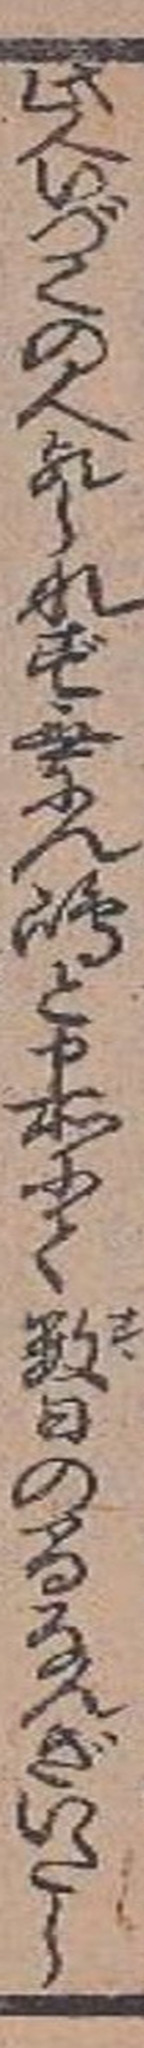此人いづくの人かしれず無にん嶋と申所にて数日の間なんぎいたし
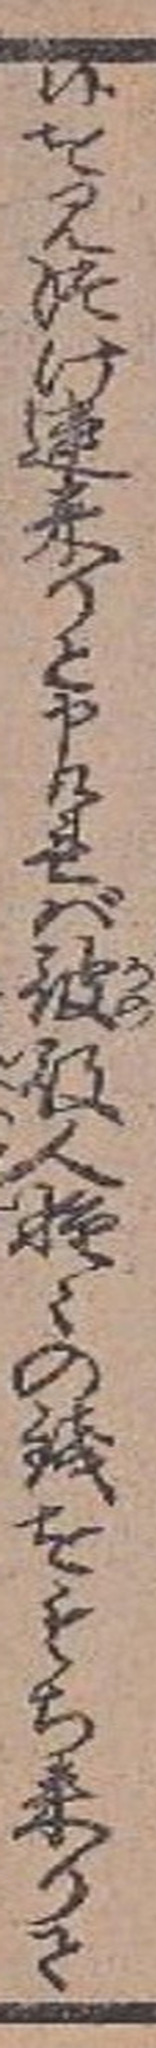候を見つけ連来りと申ければ彼役人種々の銭をもち来りて
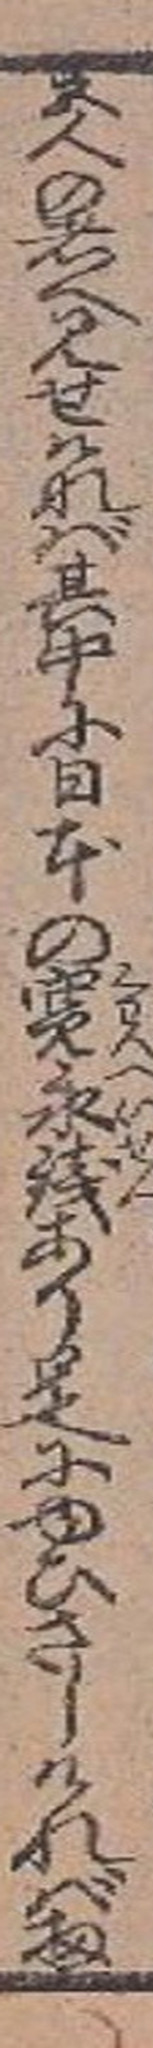五人の者へ見せければ其中に日本の寛永銭あり是にゆひさしければ扨
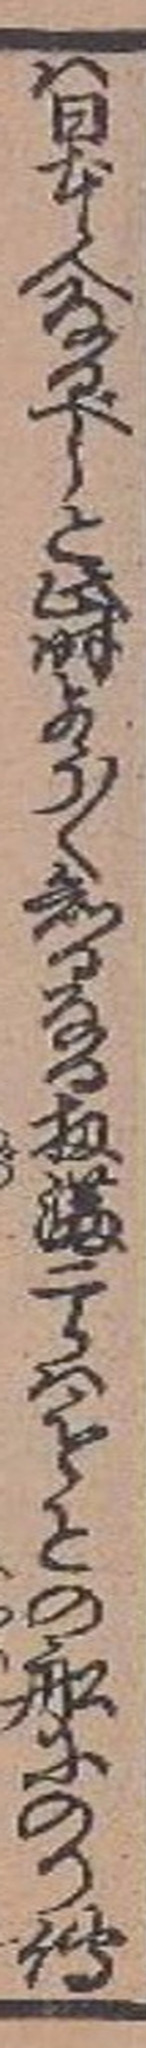は日本人なるべしと此時よう〳〵知るなる扨満二郎はもとの船にのり伝
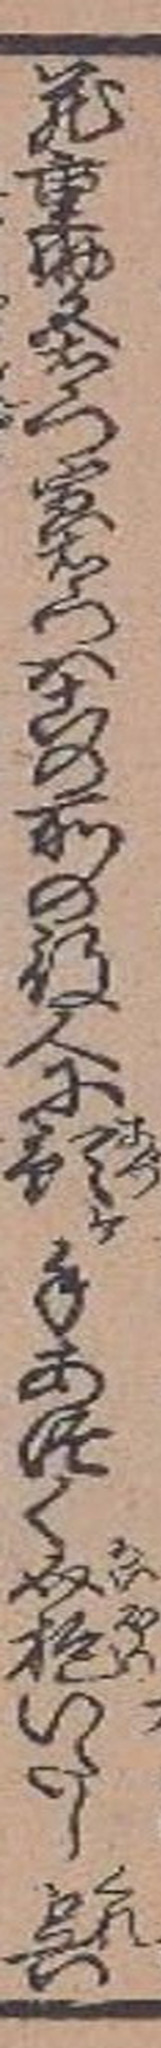蔵重助五右衛門寅右衛門はこの所役人に預け手あつく介抱いたし呉
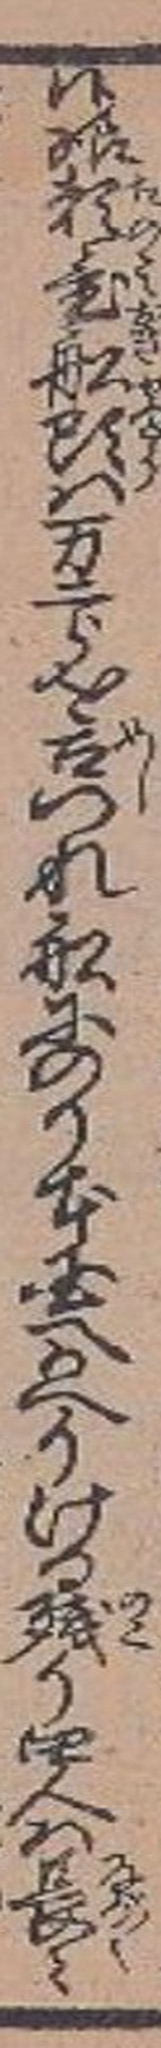候様頼置船頭は万二郎を召つれ船にのり本国へかへりける残り四人は長々
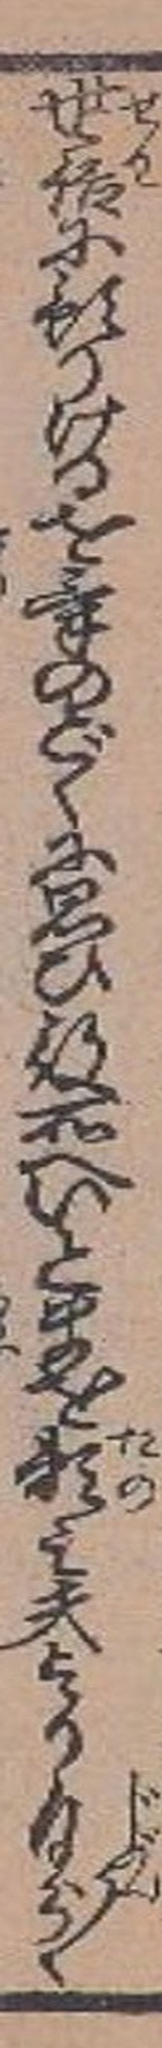世話に預りけるを気のどくに思ひ役所へいとまを頼み夫より自分〳〵
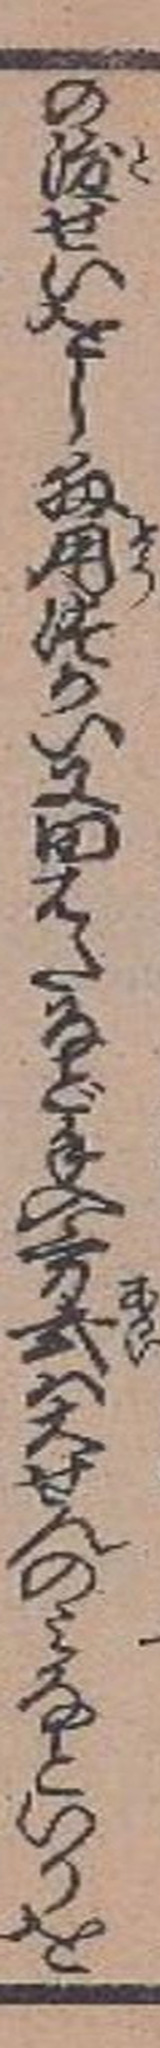の渡せいをし扨用つかい又田はたなど手入方或は大せんのみなといりを
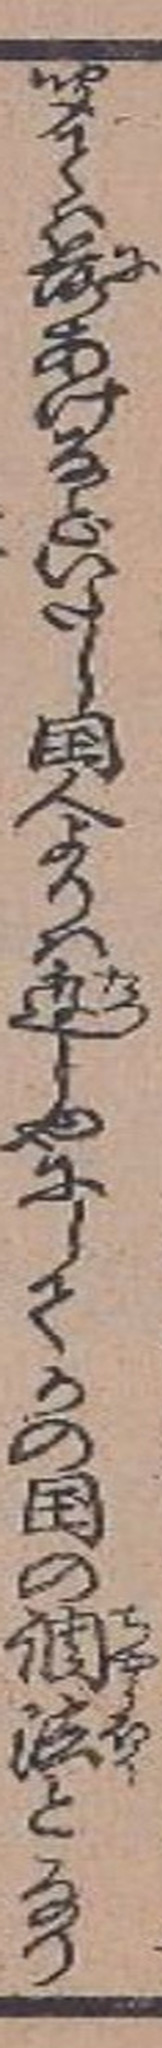聞ては荷あけなどいたし国人よりは達しやにしてかの国の調法となり
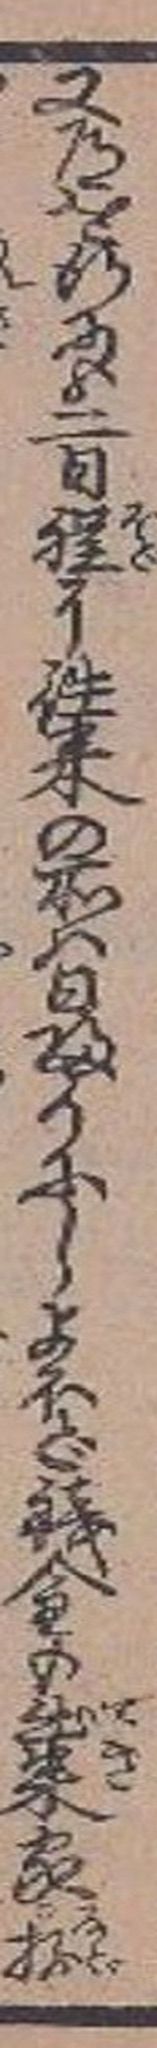又道を行にも二日程に往来の所は日帰りにしよほど銭金の出来家抔
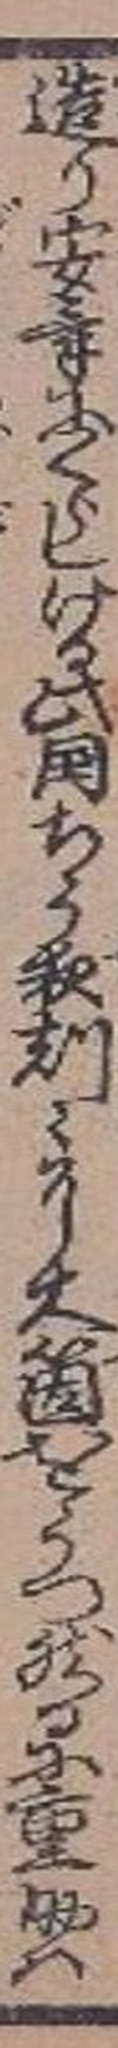造り安気にくらしける此国ちう夜刻々に大筒をうつ然るに重助は
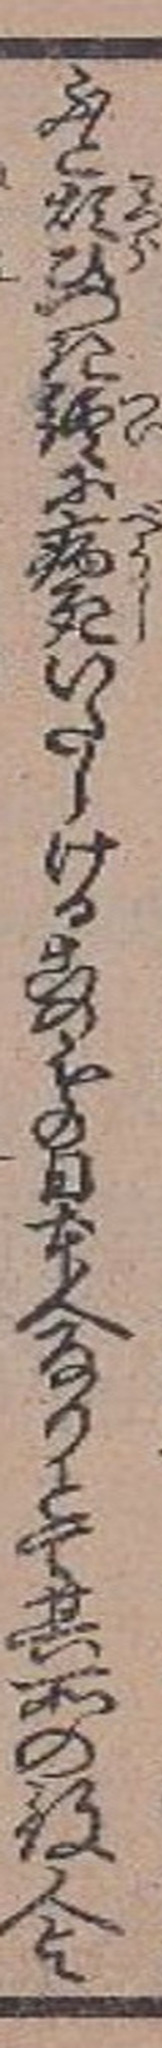ふと煩ひつき終に病死いたしけるこのもの日本人なりとて其所の役人よ
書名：満次郎漂流記
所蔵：University of the Ryukyus Library
